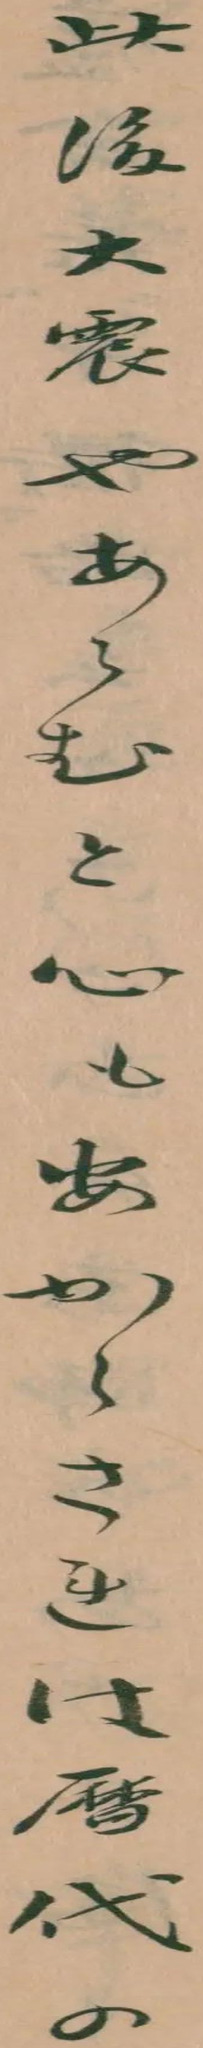此後大震やあらむと心も安からされは暦代の
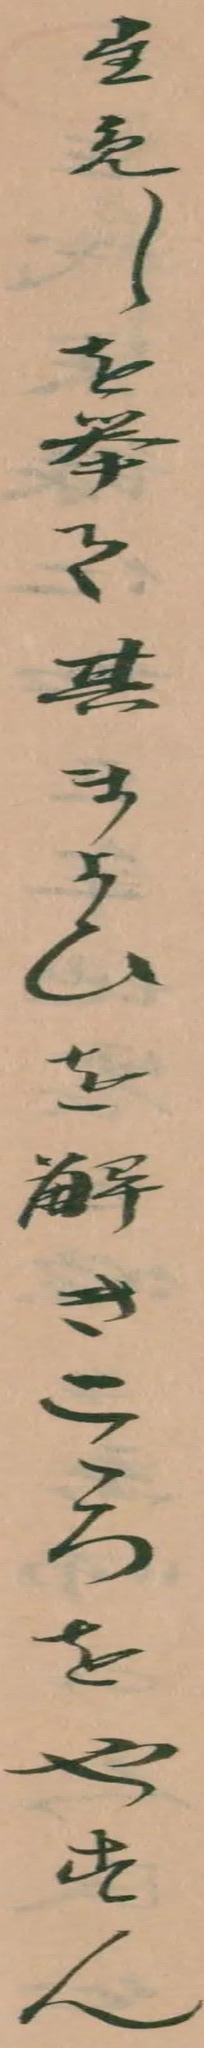ためしを挙て其まよひを解きこゝろをやすん
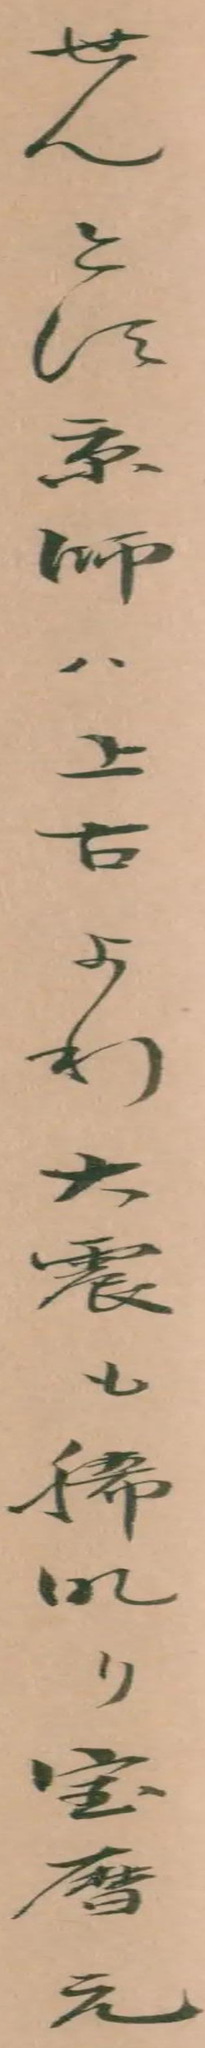せんとす京師は上古より大震も稀なり宝暦元
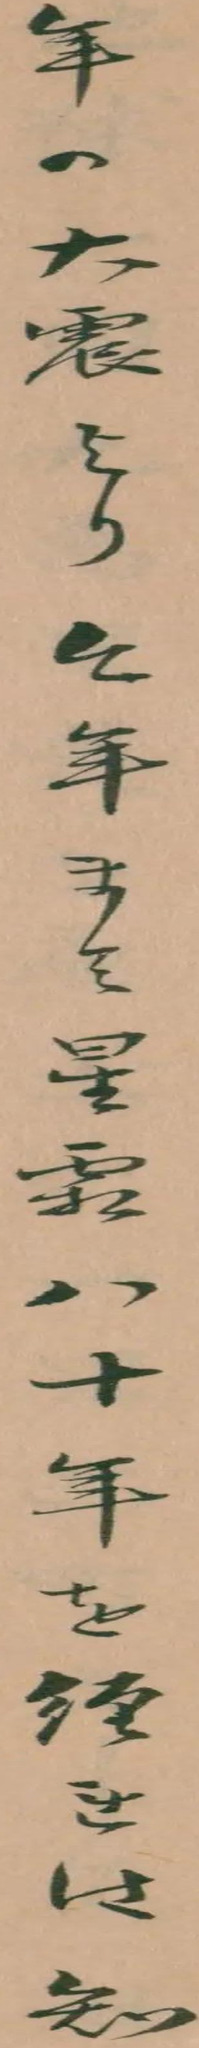年の大震より今年まて星霜八十年を経れは知
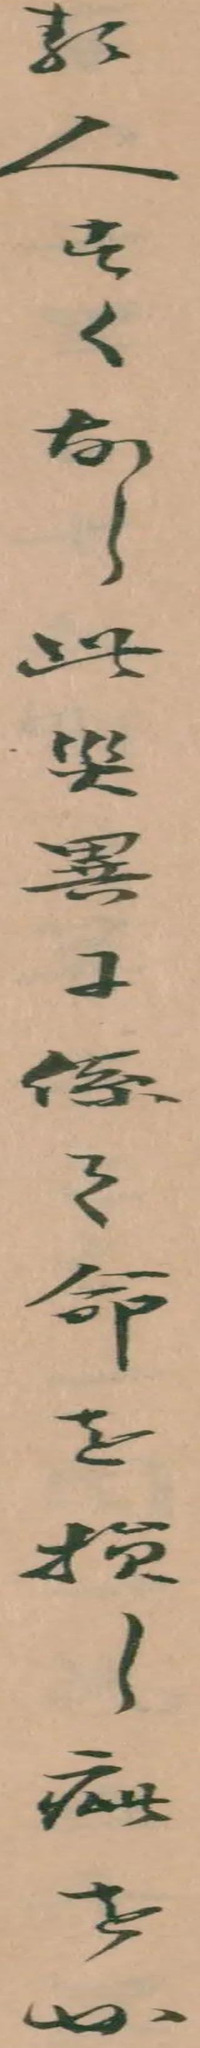る人すくなし此災異に係て命を損し疵をか
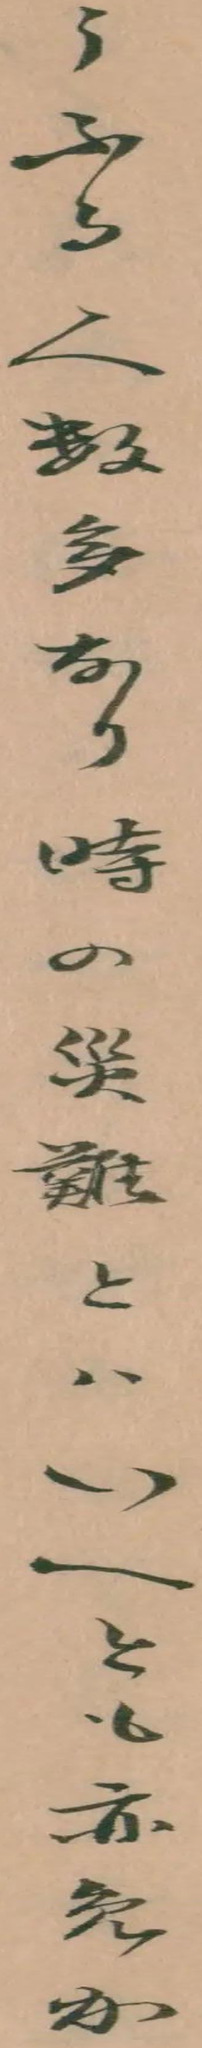うふる人数多なり時の災難とはいへとも亦免か
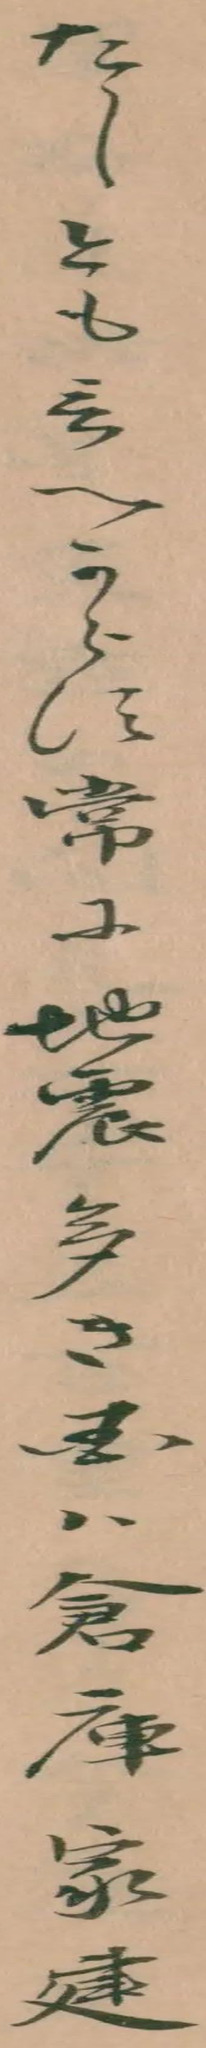たしとも言へからす常に地震多き国は倉庫家建
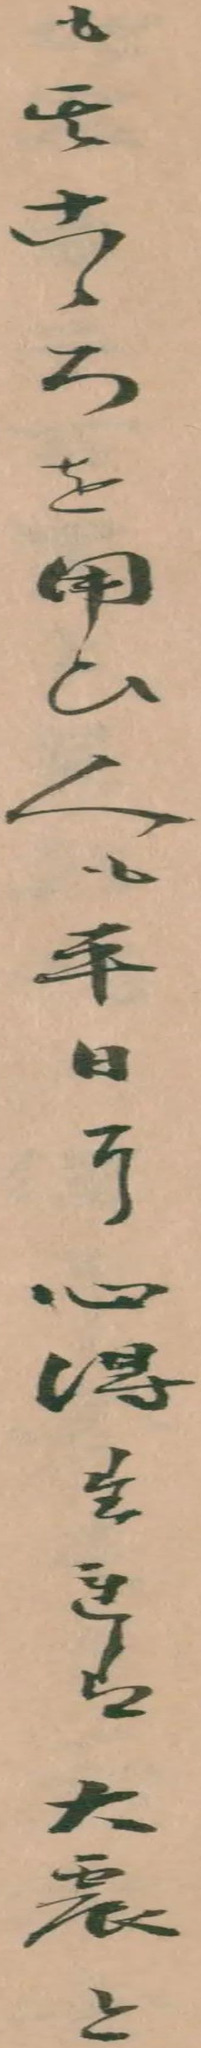も其こゝろを用ひ人も平日に心得たれは大震と
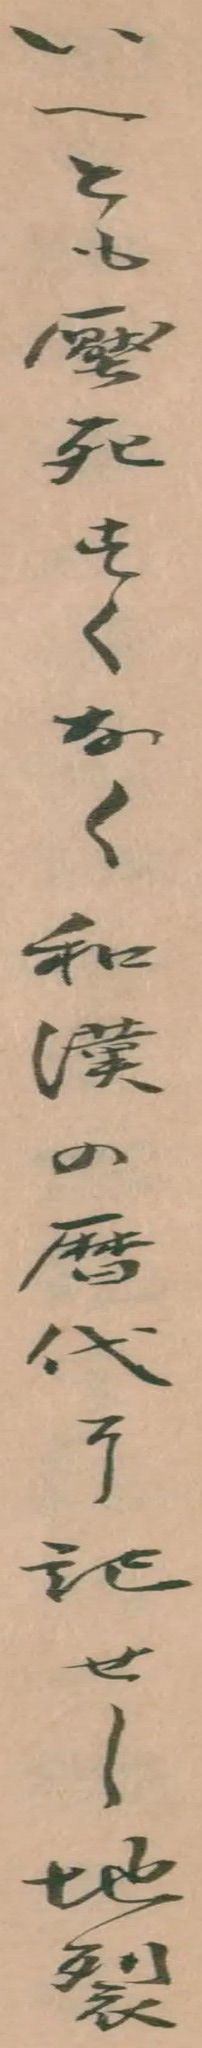いへとも圧死すくなく和漢の暦代に記せし地裂
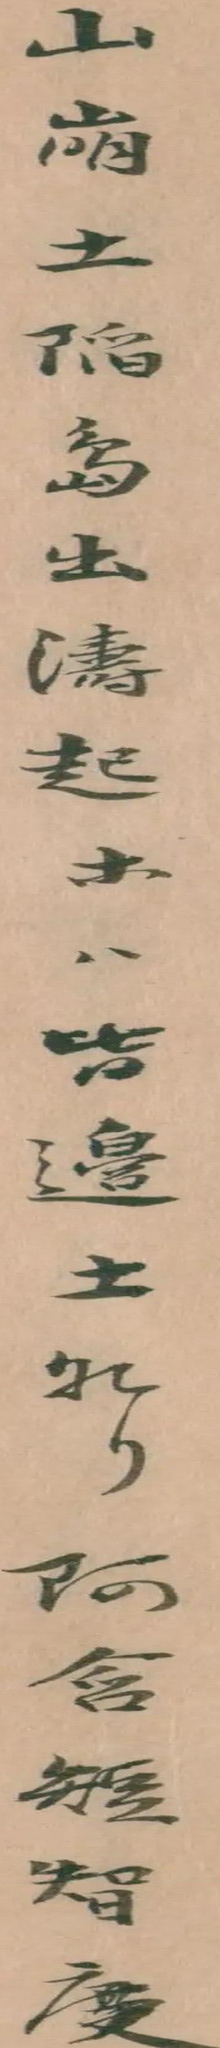山崩土陥島出涛起等は皆辺土なり阿含短智慶
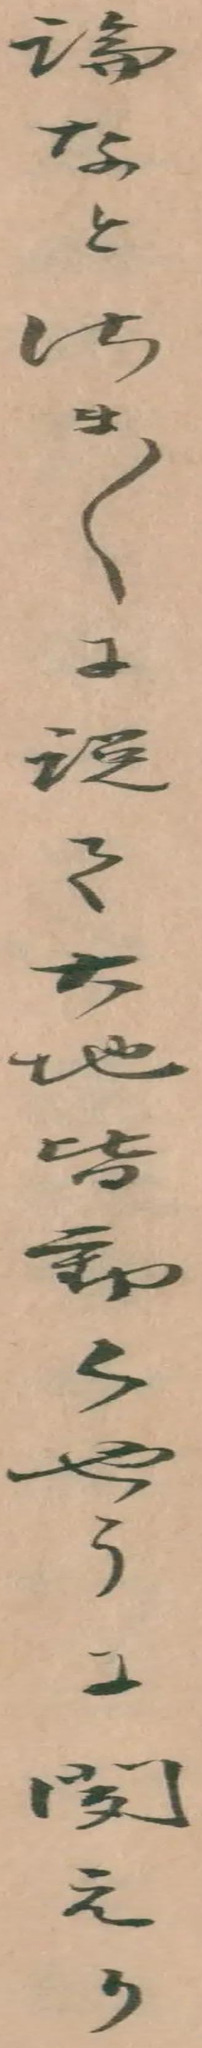論なとさま〳〵に説て大地皆動くやうに聞えり
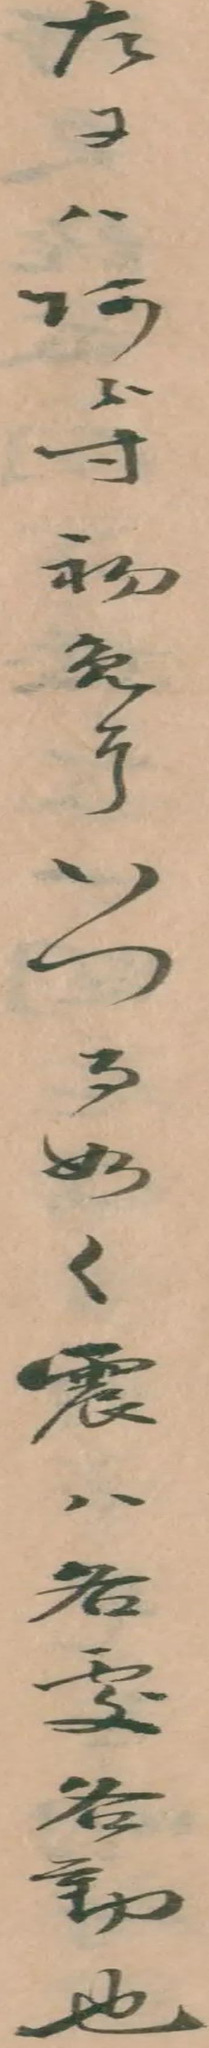さにはあらす發初めにいつる如く震は各処各動也

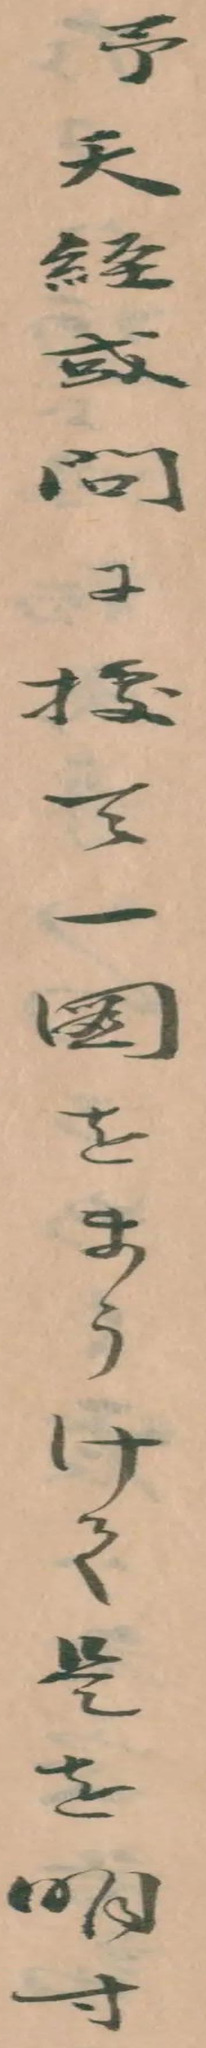予天経或問に據て一図をまうけて是を明す
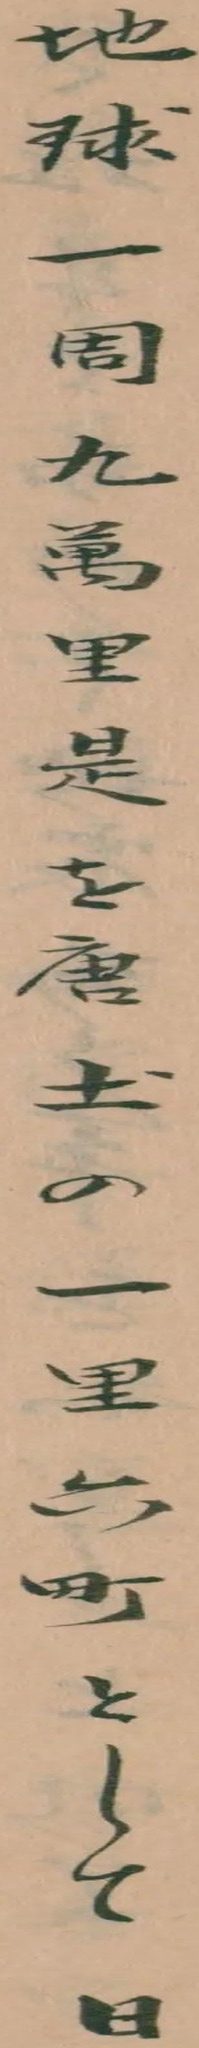地球一周九万里是をとう唐土の一里六町として日
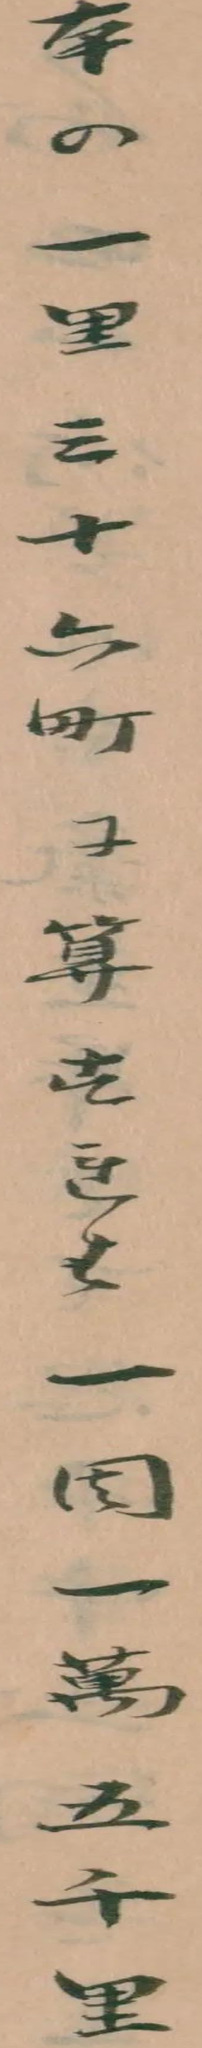本の一里三十六町に算すれは一周一万五千里
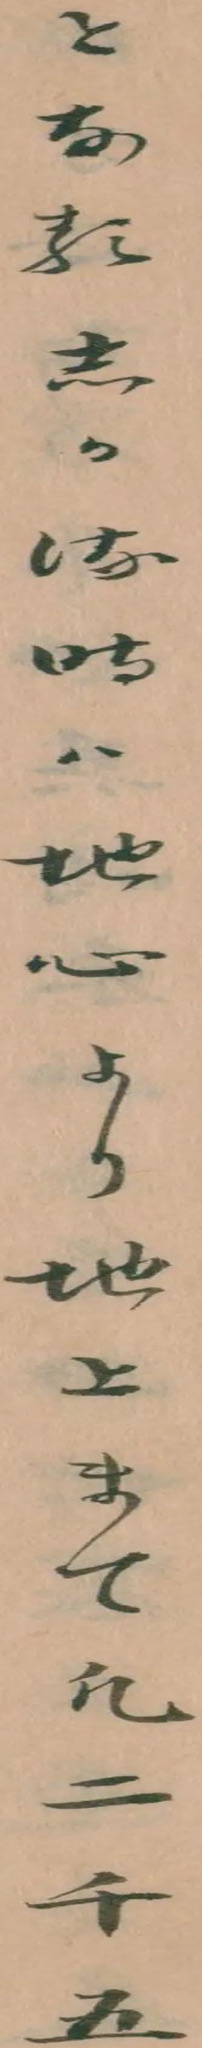となるしかる時は地心より地上まて凡二千五
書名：地災撮要. 巻5-6(地震之部)
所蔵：国立国会図書館 National Diet Library, JAPAN
